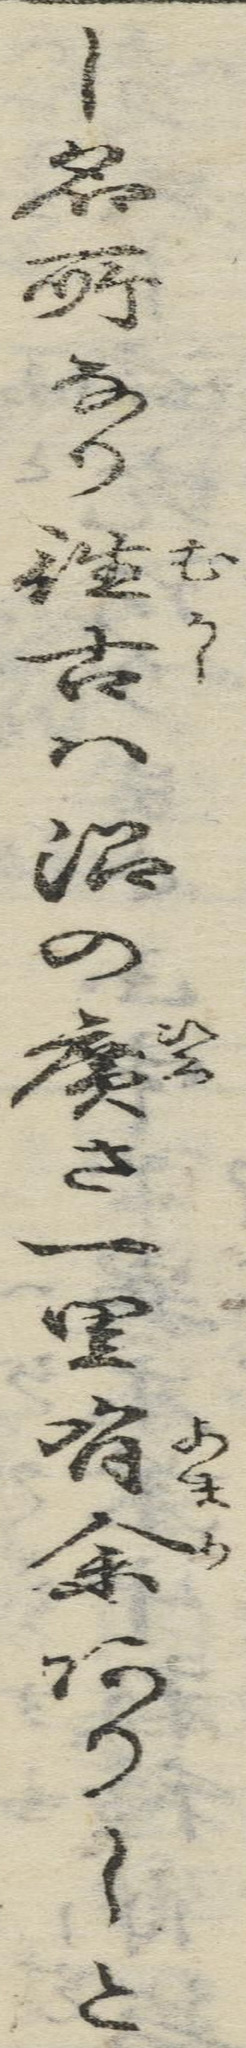し名所なり往古は沼の廣さ一里有余ありしと
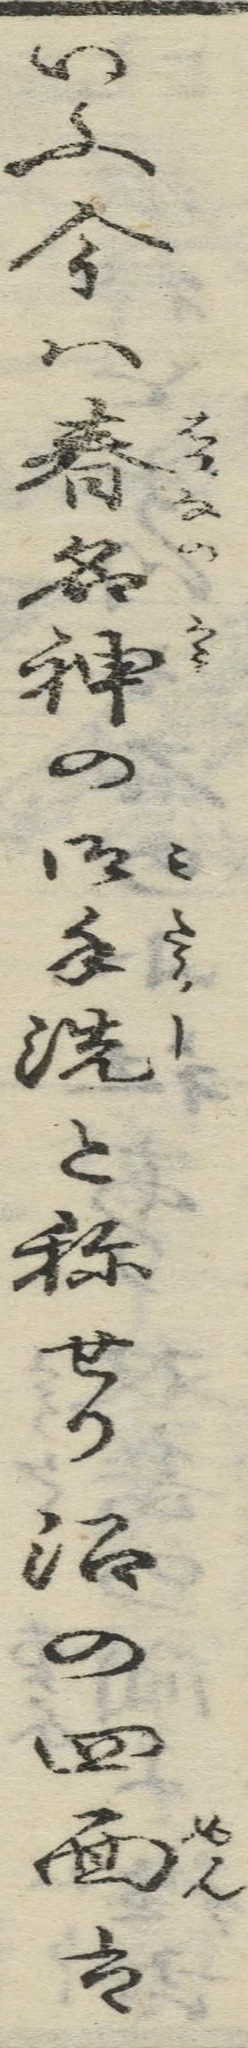いふ今は春名神の御手洗と称せり沼の四面は
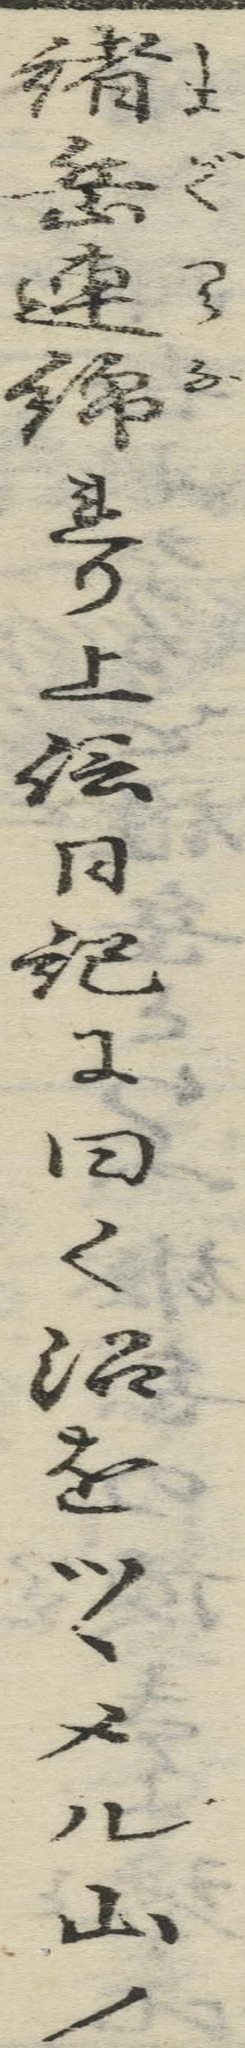諸岳連綿り上総日記に曰く沼をツゝメル山ノ
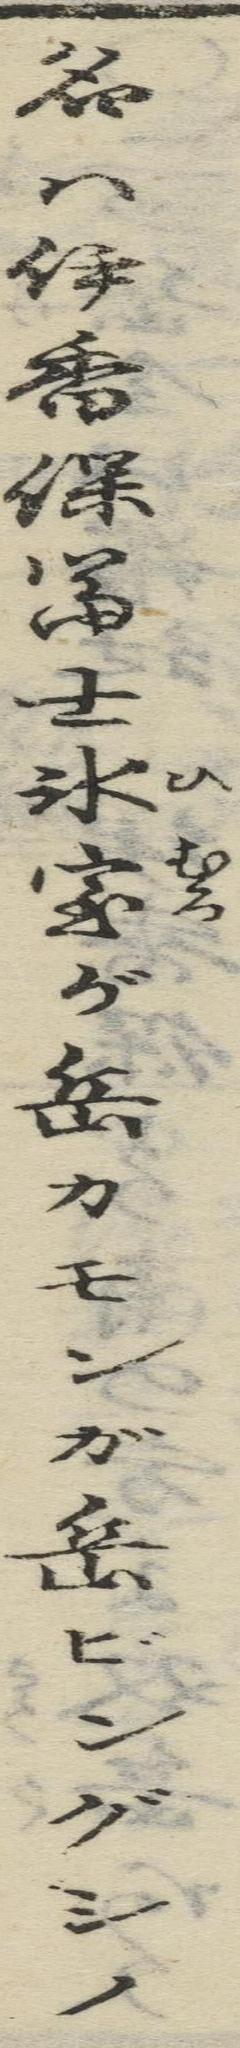名ハ伊香保富士氷室が岳カモンガ岳ビングシノ
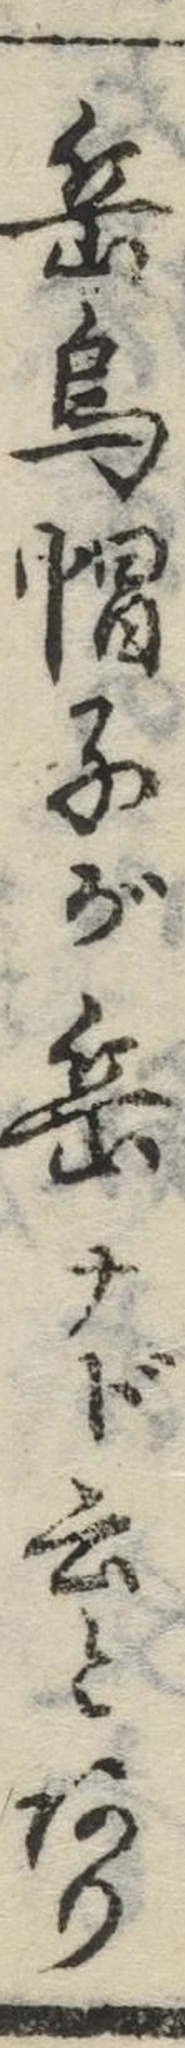岳烏帽子が岳ナド云とあり
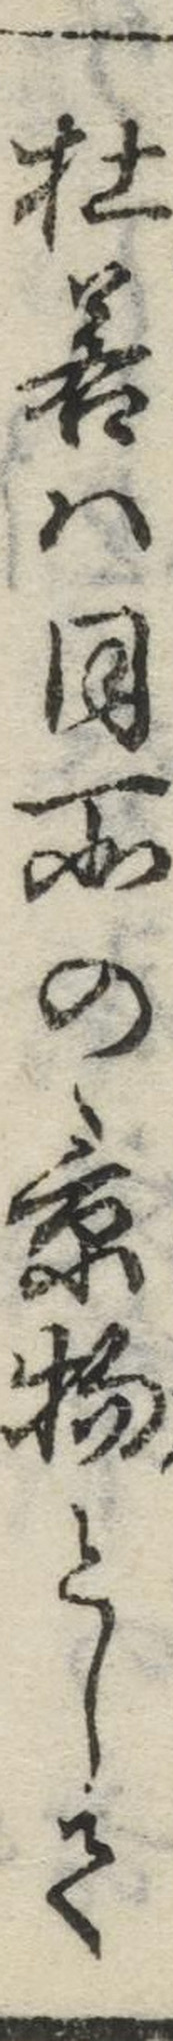杜若は同所の景物として
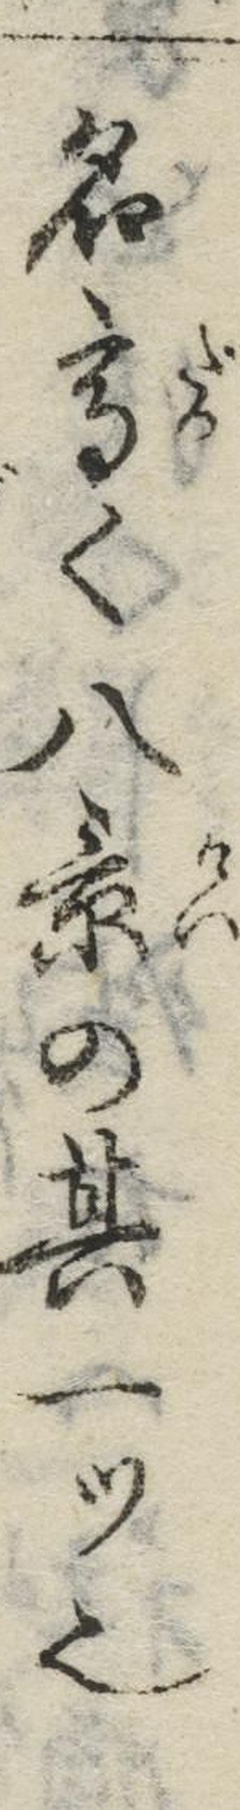名高く八景の其一つ也
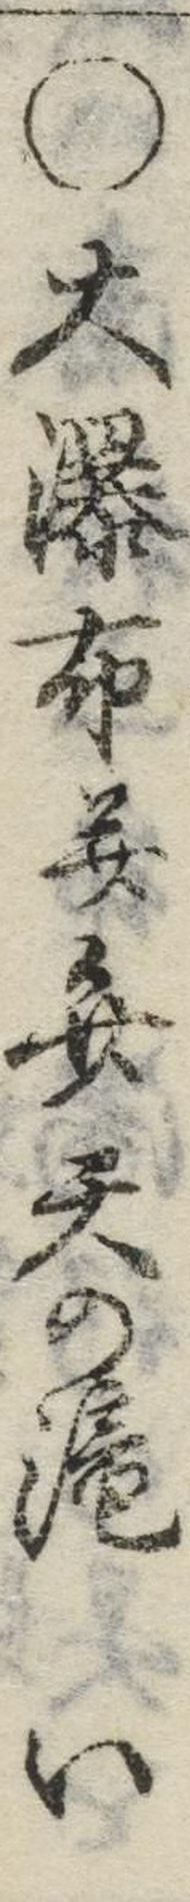○大瀑布并弁天の滝い
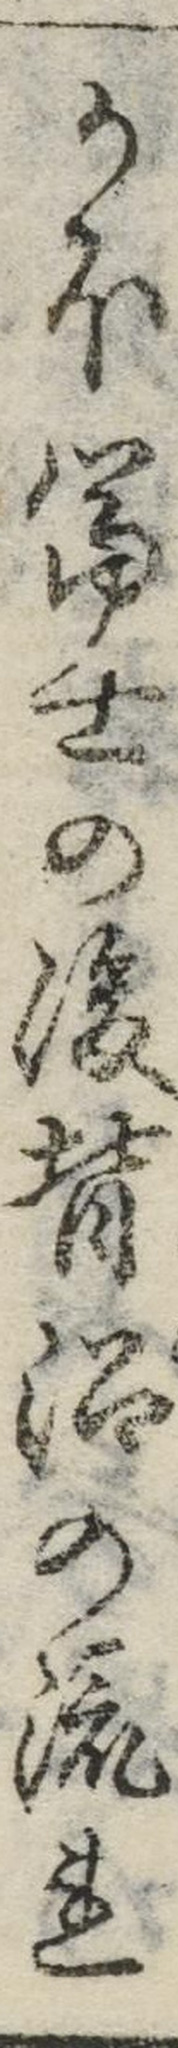かほ富士の後背沼の流れ
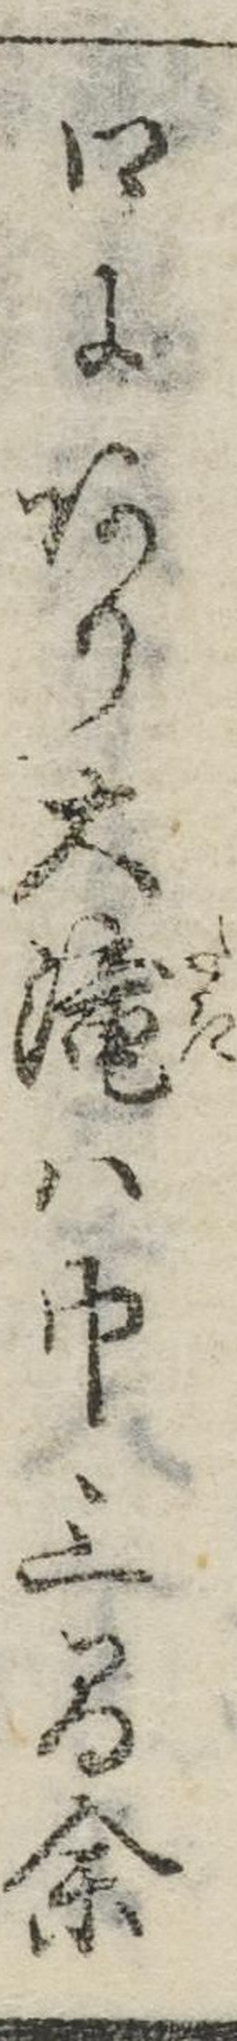口にあり大滝は巾三間余
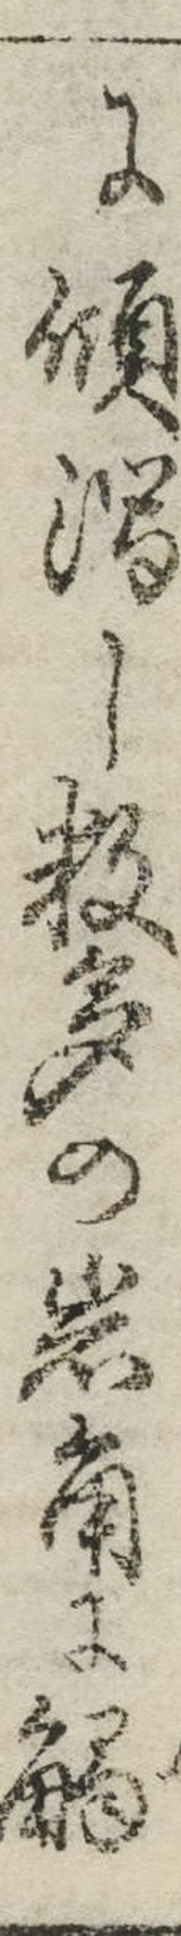に傾泻？し数多の岩角に触
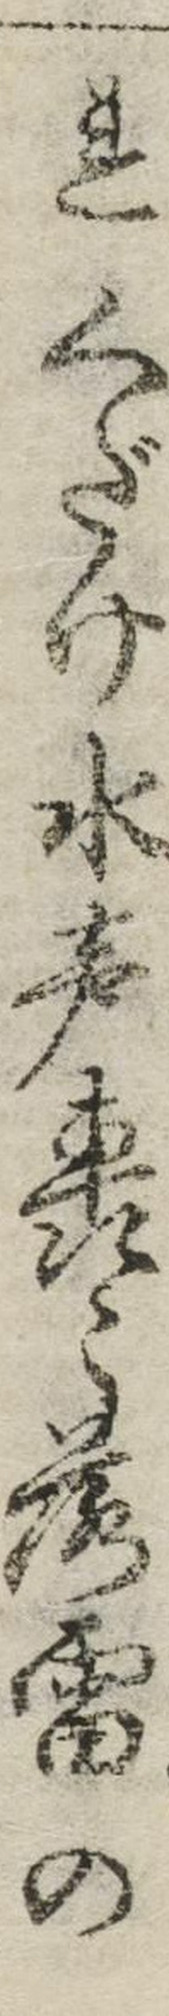れくだけ水声轟々落雷の
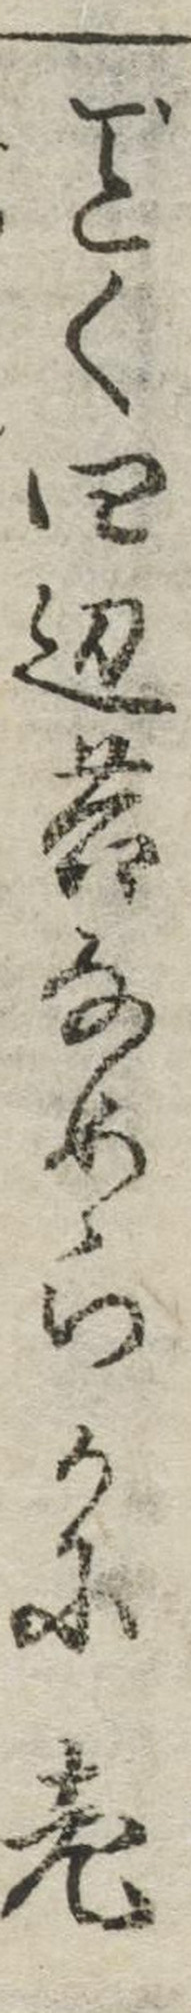ごとく四辺苔なめらかに老
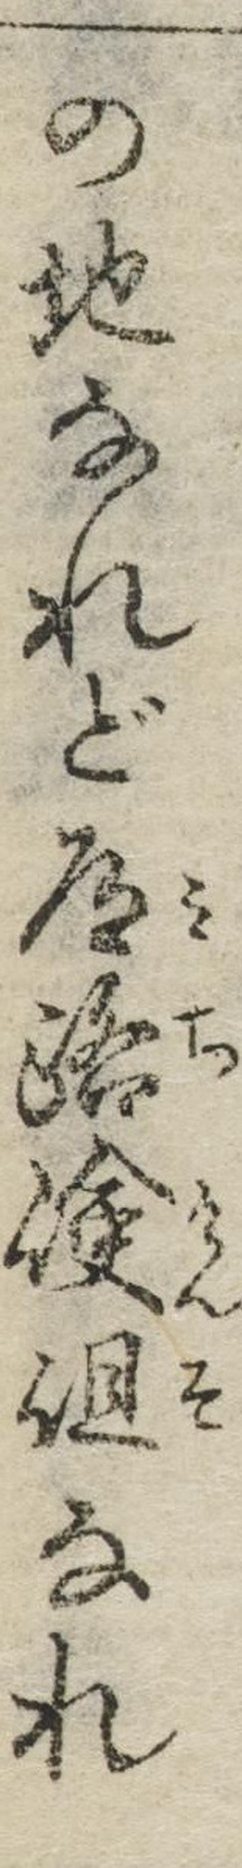の地なれど道路険阻なれ

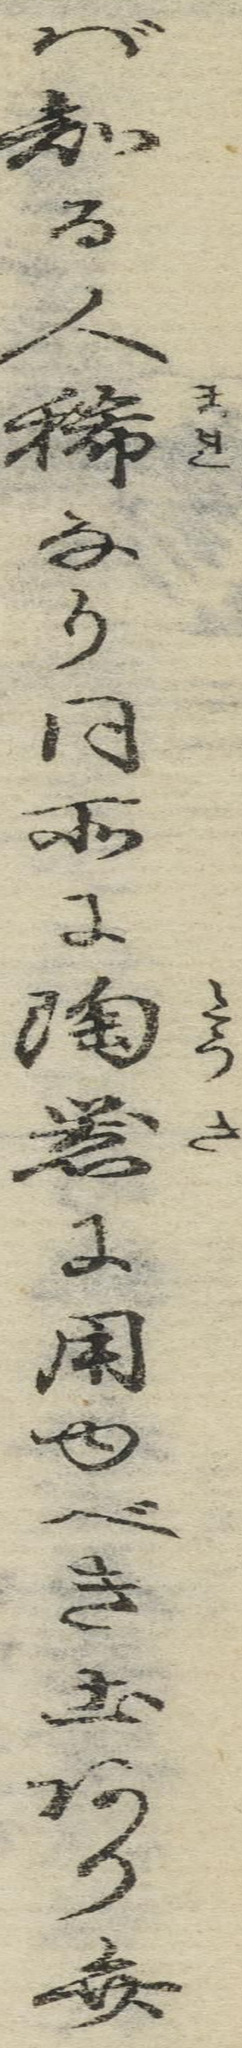ば知る人稀なり同所に陶器に用ゆべき土あり弁
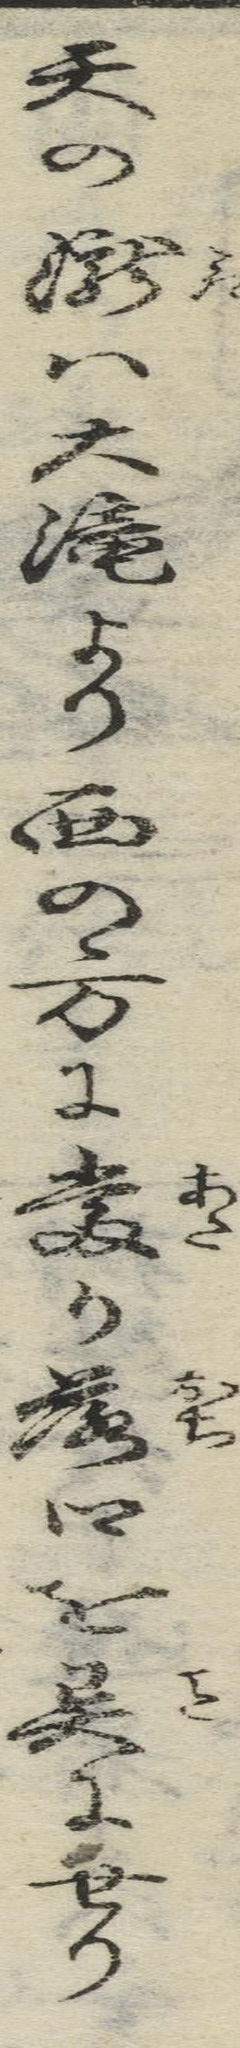天の瀧は大滝より西の方に當り落口を異にせり
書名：上州伊香保鑛泉圖會　全
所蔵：東京大学地震研究所図書室 Earthquake Research Institute Library, The University of Tokyo, JAPAN
